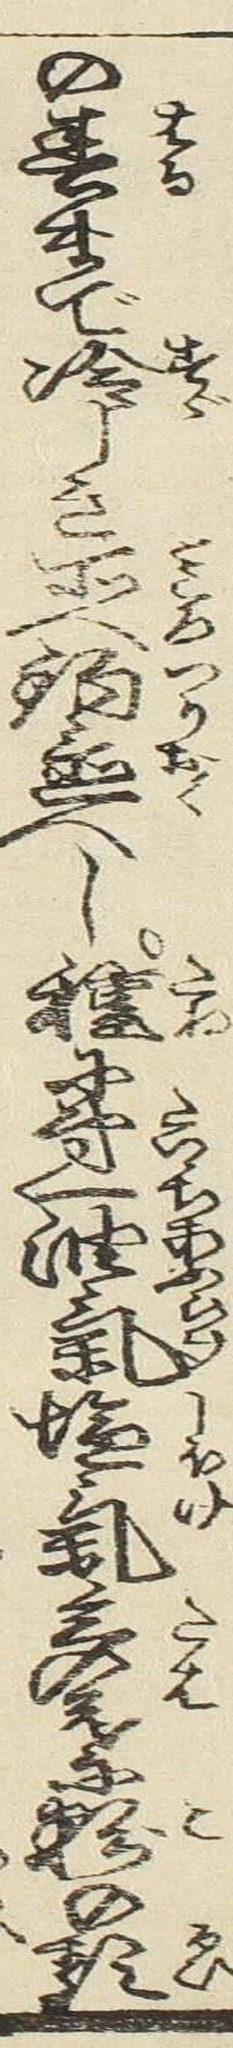の春まで冷しき所へ釣置へし。種に第一油気塩気多葉粉の類
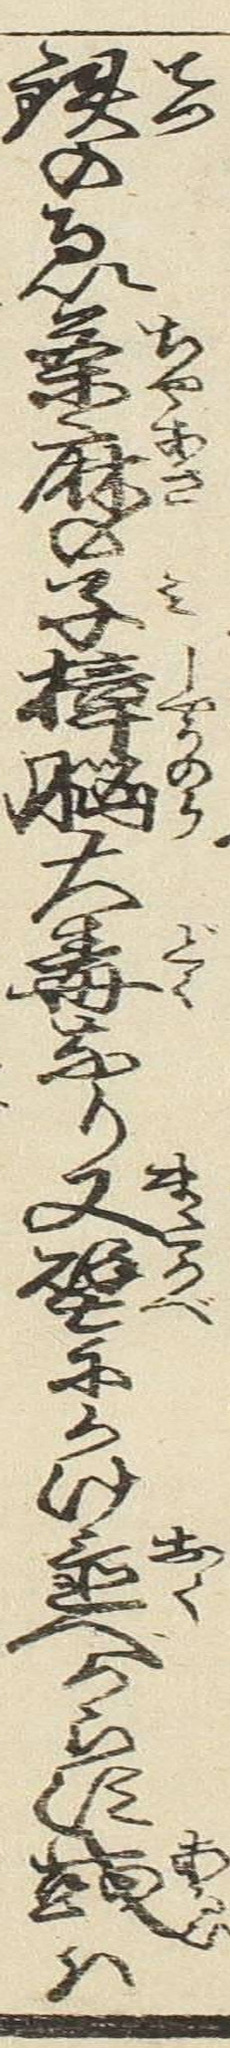鉄のるい茶麻の子樟脳大毒なり又壁にかけ置へからす或は
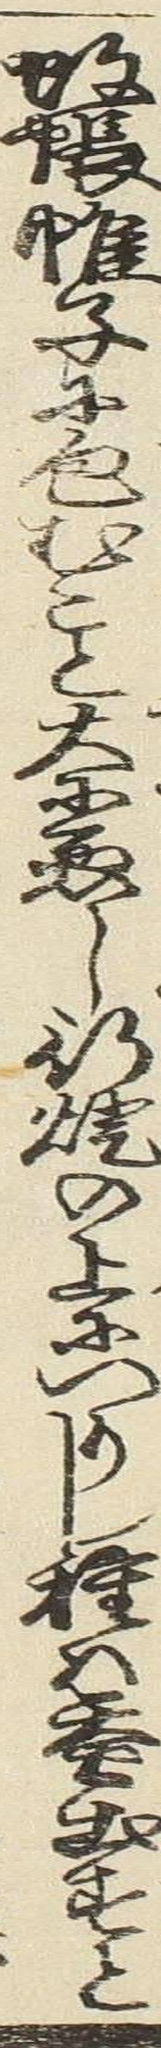蚊帳帷子に包むこと大に悪し。行燈の上につりし種は蚕出ずと
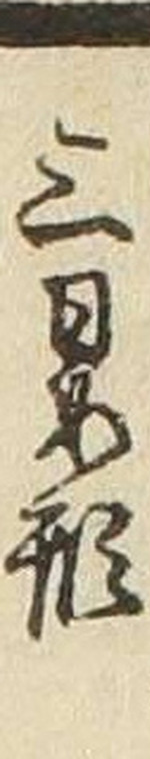三日め形
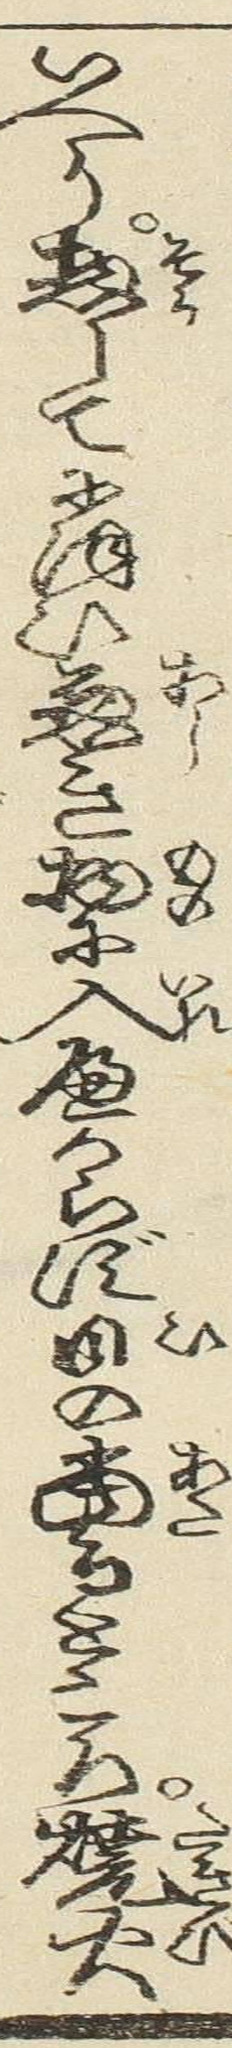いへり。惣してにほひ悪き物に入へからず日の当るところ。焼火
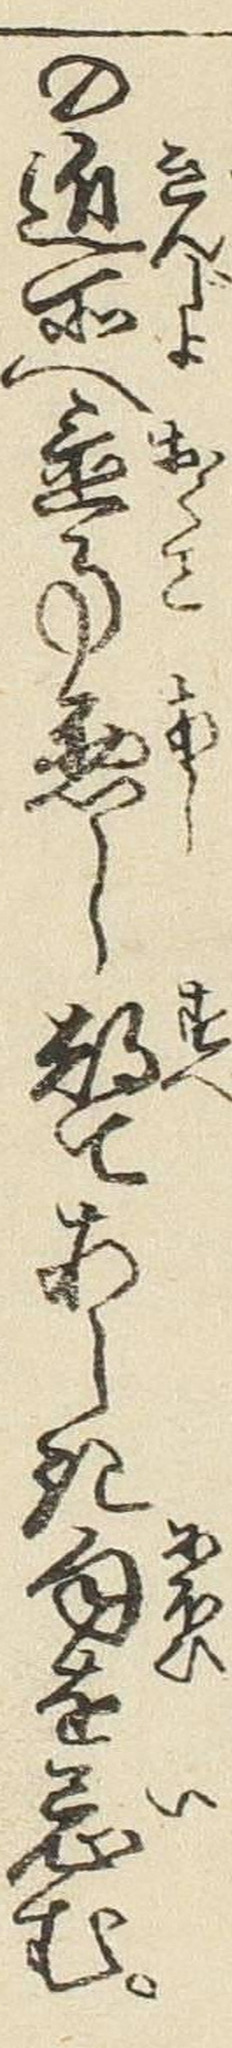の近所へ置事悪し都てあしき匂を忌む。
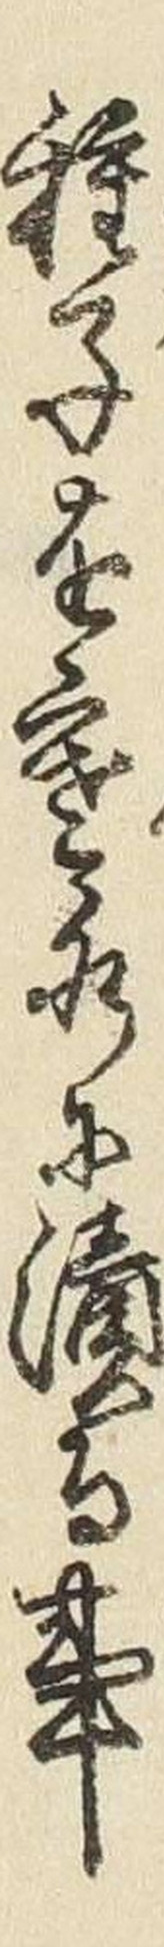種子を寒水に漬る事
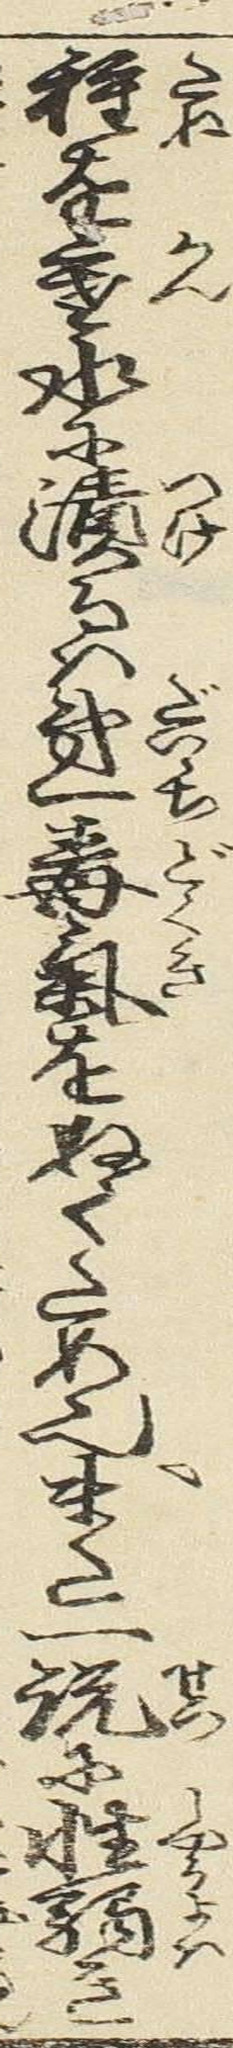種を寒水に漬るは第一毒気をぬくため也。また一説に性弱き
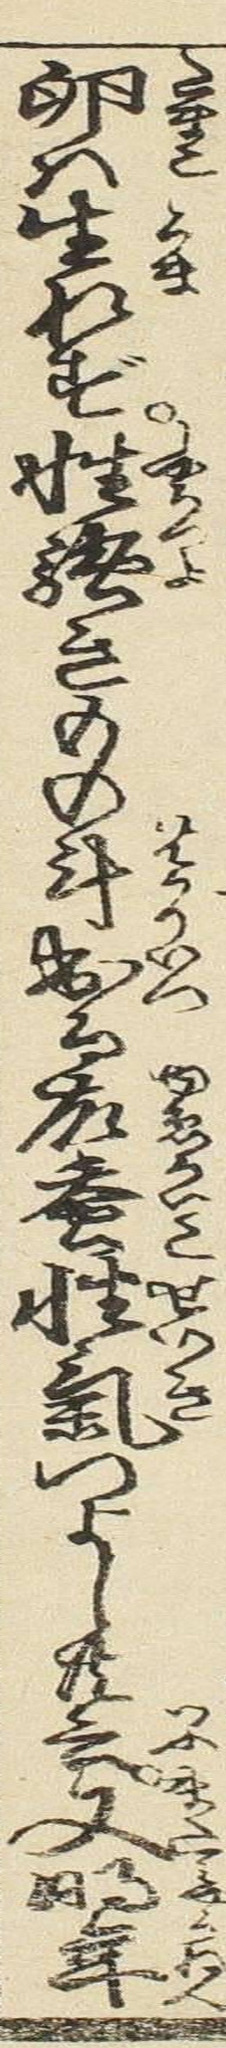卵は生れず。性強きもの計出る故蚕性気つよし共云。又明年
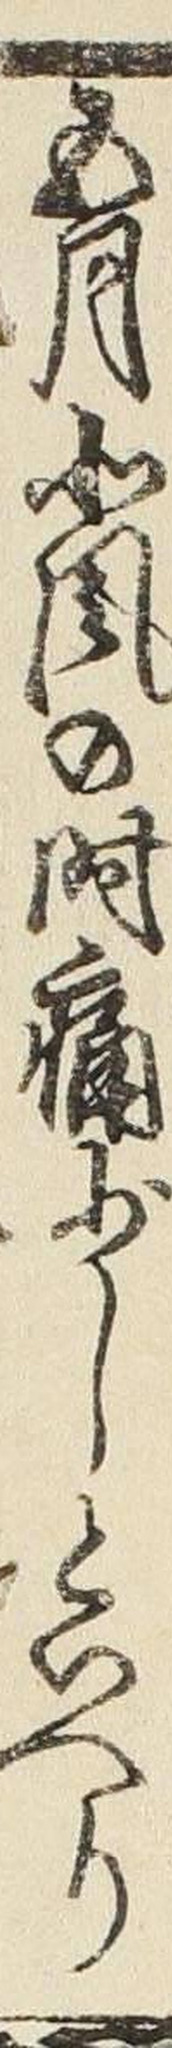五月北風の時痛少しといへり
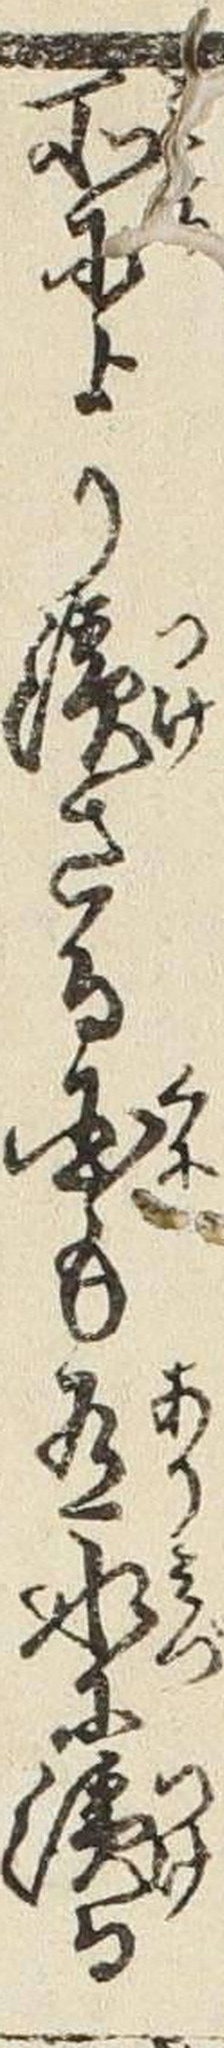所により漬さる国も有水に漬る
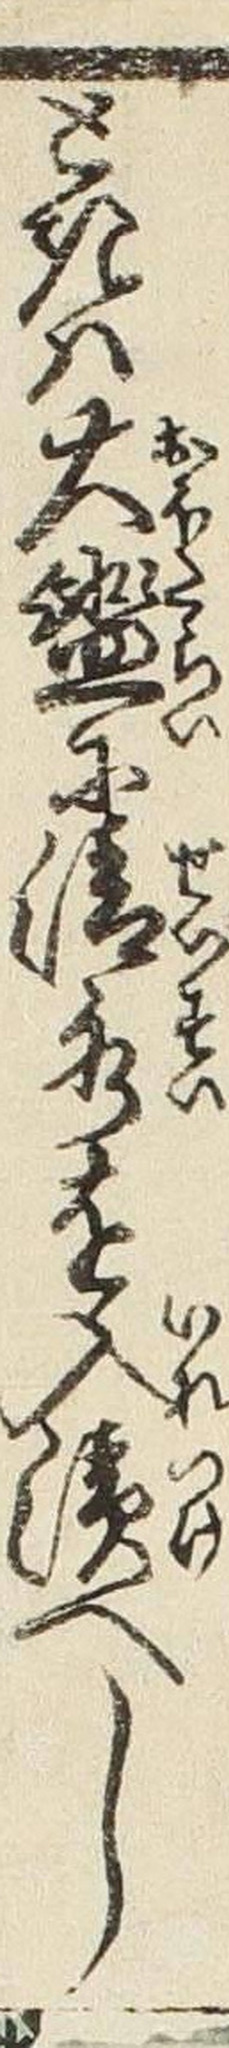ときは大盥に清水を入漬へし
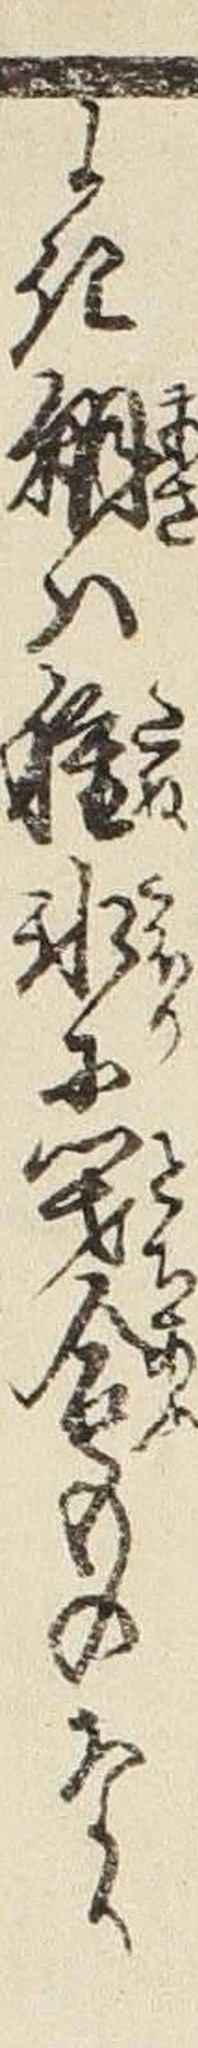よき朝は種氷に閉合ものなり
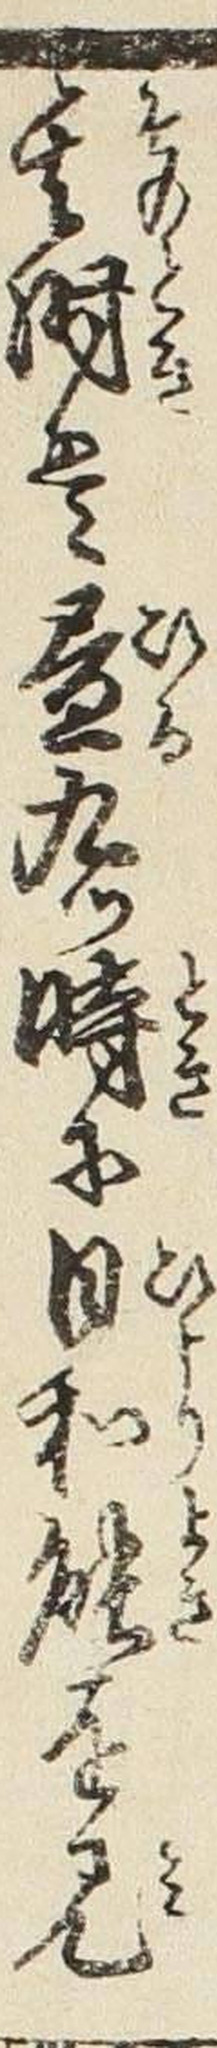其時は昼九ッ時に日和能を見
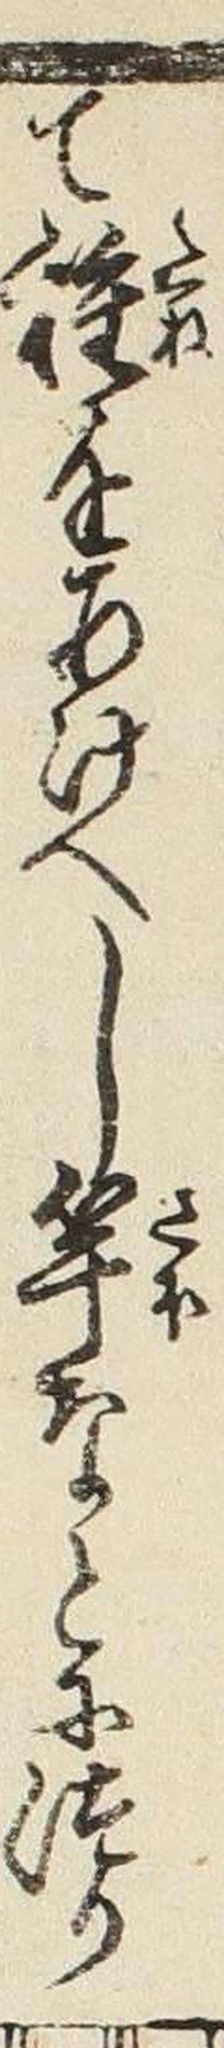て種をあけへし竿なとにつり
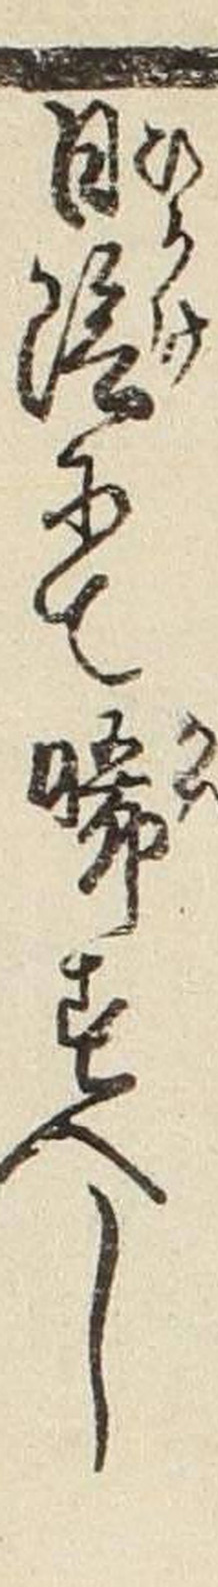日陰にて晞すへし
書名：養蠶圖解
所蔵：東京大学農学生命科学図書館 国文学研究資料館
